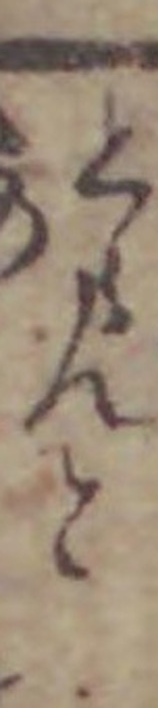とらんと
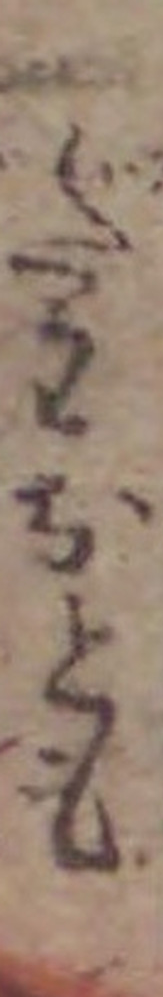だわおとも
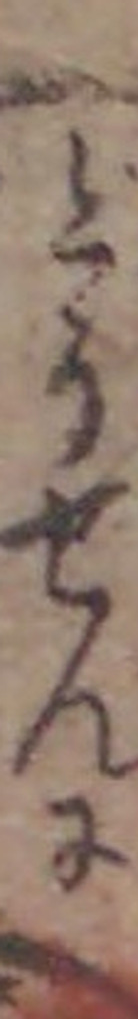どうせんに
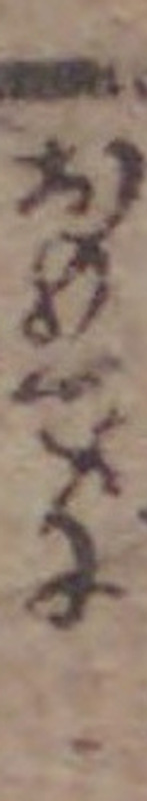おもてに
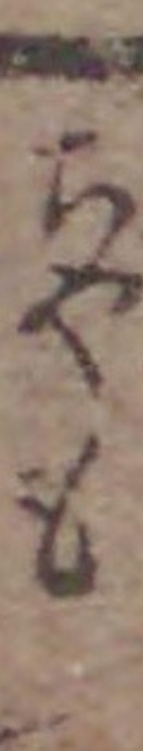ちやも
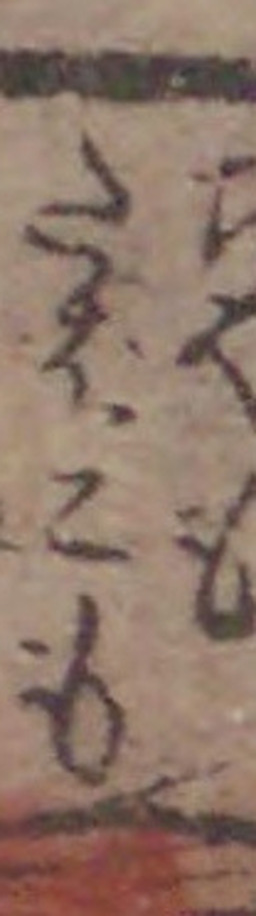たばこも
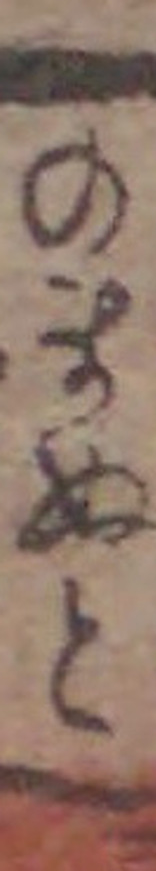のまぬと
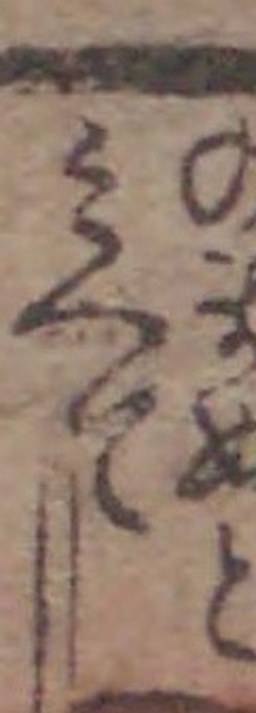みへて

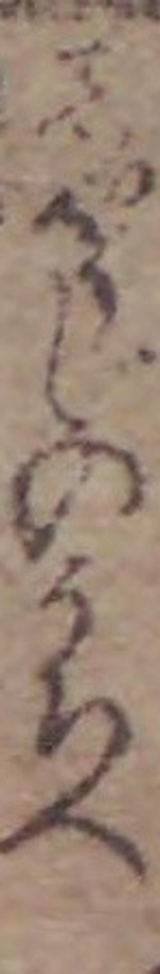しやうじのうちへ
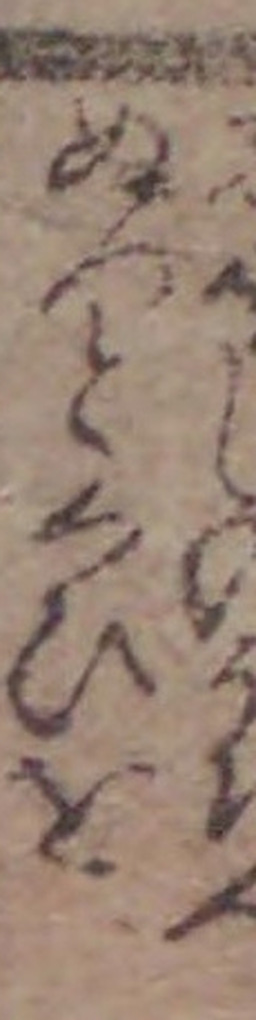ぬつとくひを
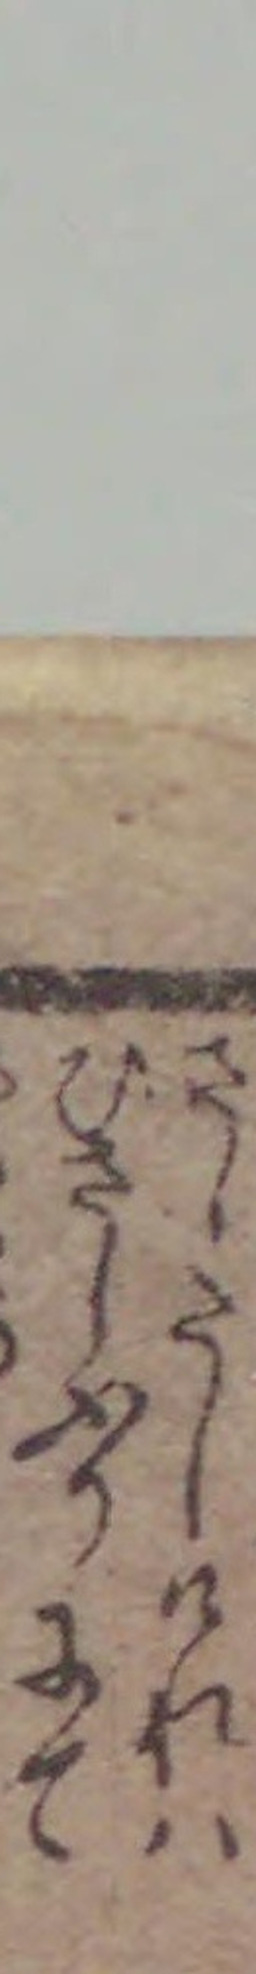ひさしふりにて
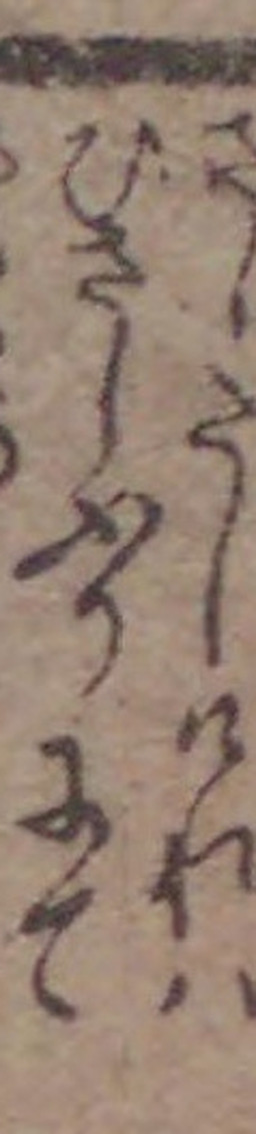ひさしふりにて
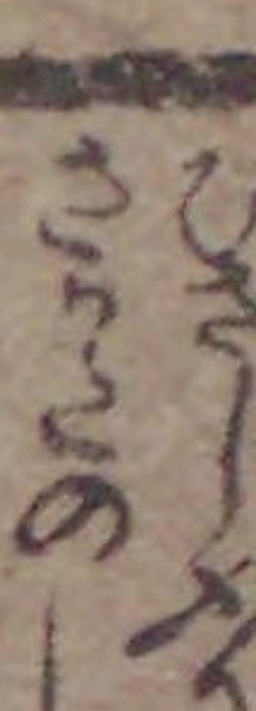さかたの
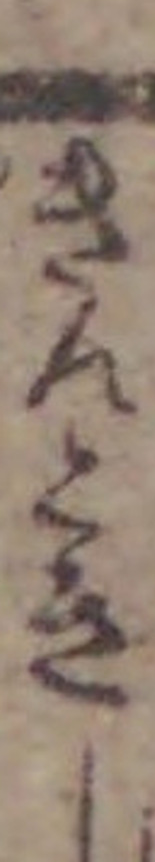きんとき
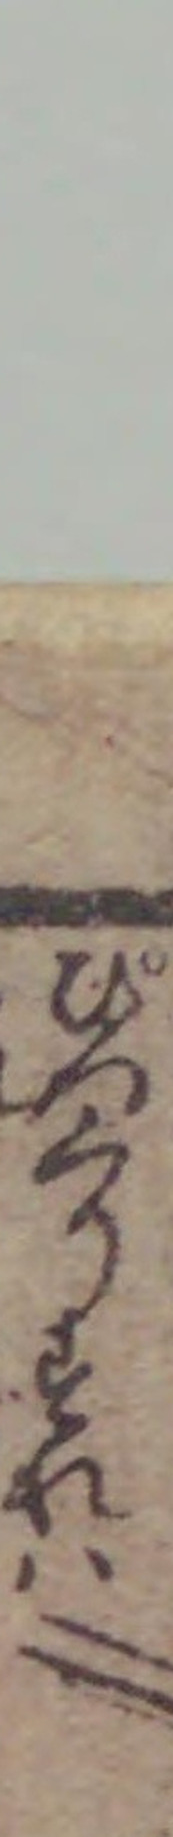ぴつくりすれは
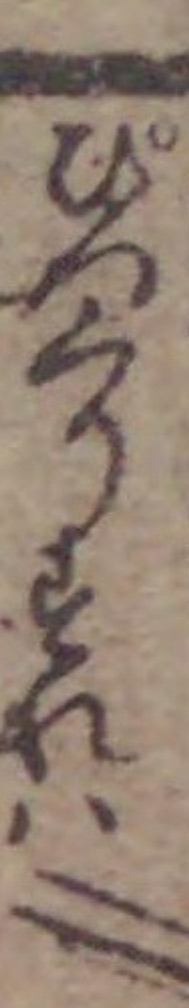ぴつくりすれは
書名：化物鼻がひしげ 2巻
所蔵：国立国会図書館 National Diet Library, JAPAN
